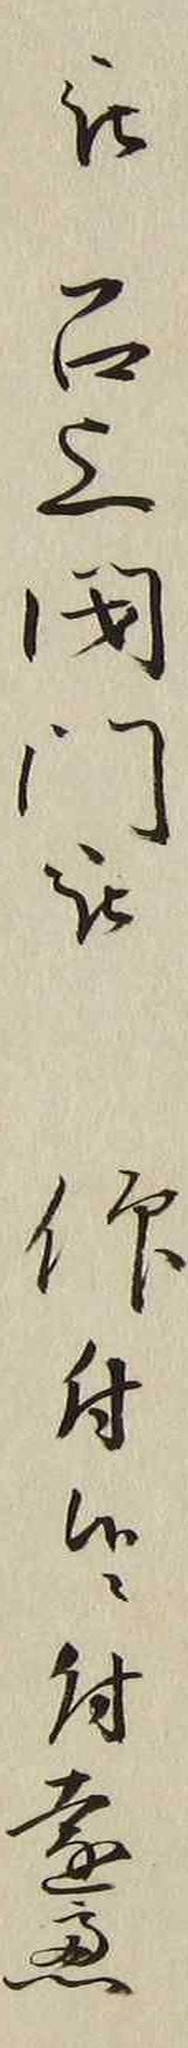被召上閉門被仰付候ニ付遠慮
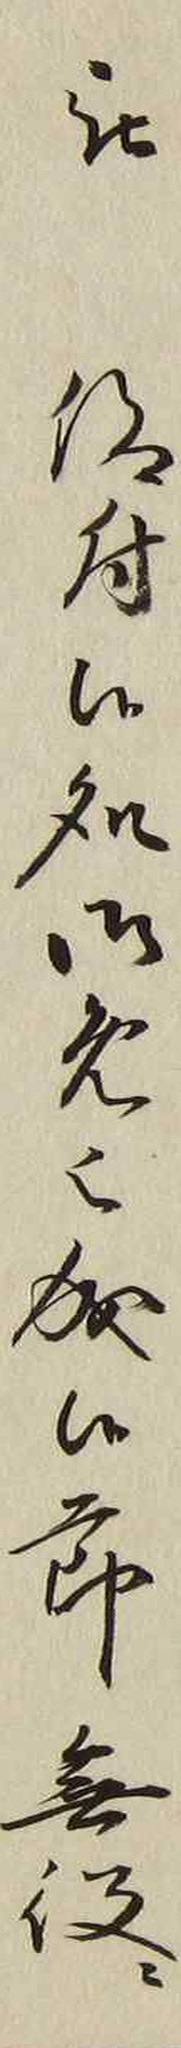被仰付候処御免被成候節無役ニ
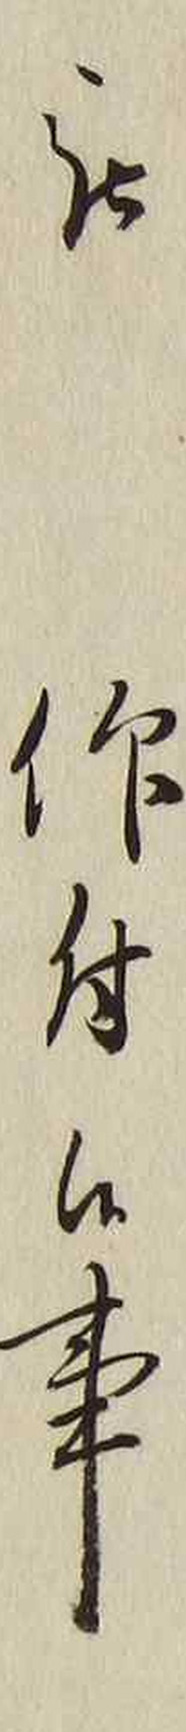被仰付候事

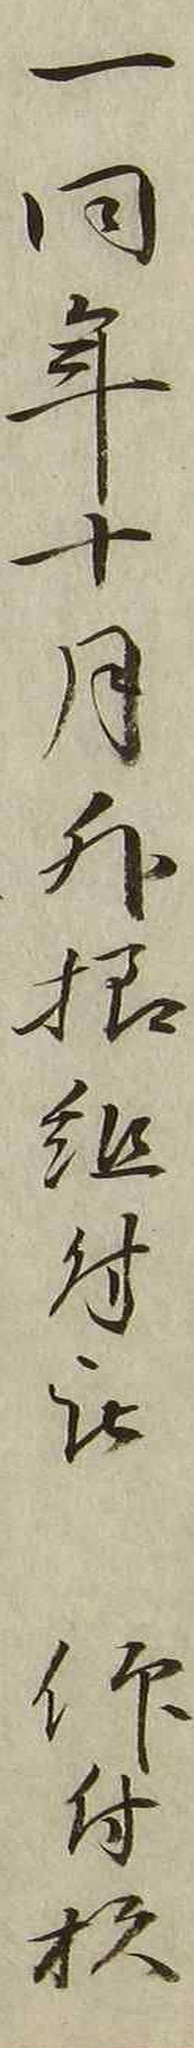一同年十月外様組付被仰付杉
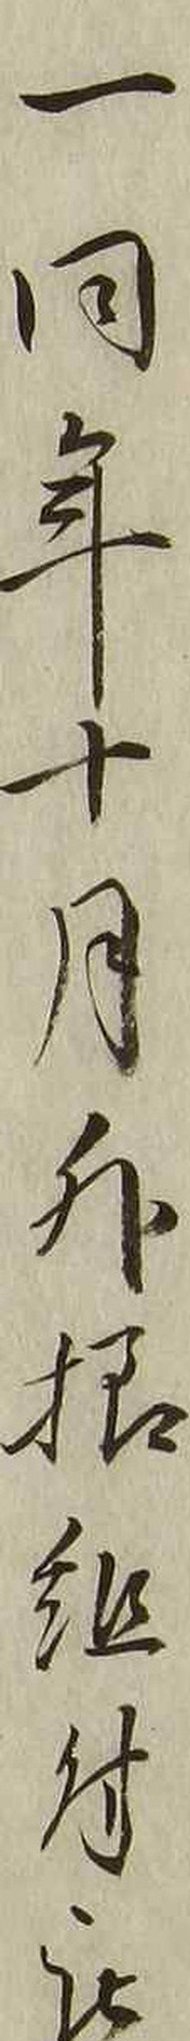一同年十月外様組付被仰付杉
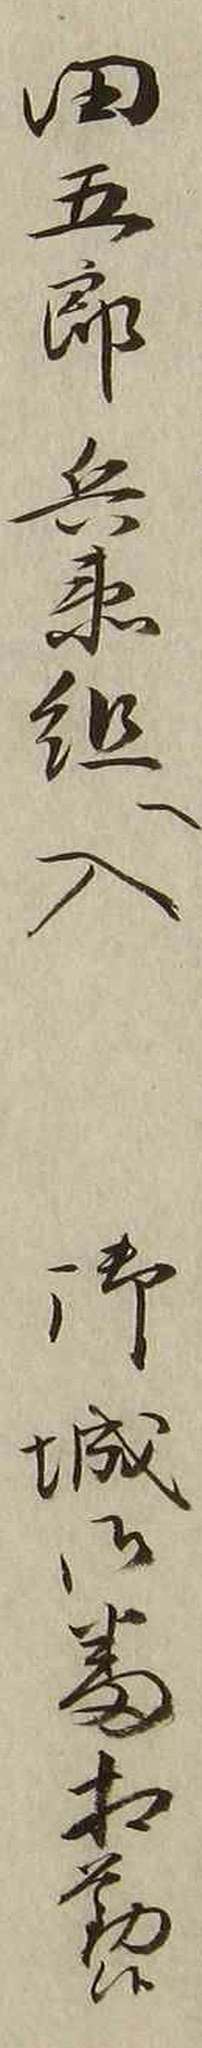田五郎兵衛組へ入御城御番相勤候
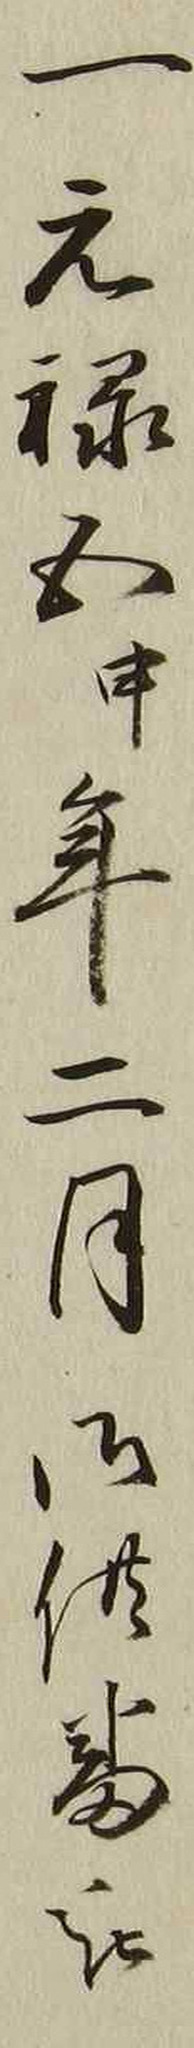一元禄五申年二月御供番被
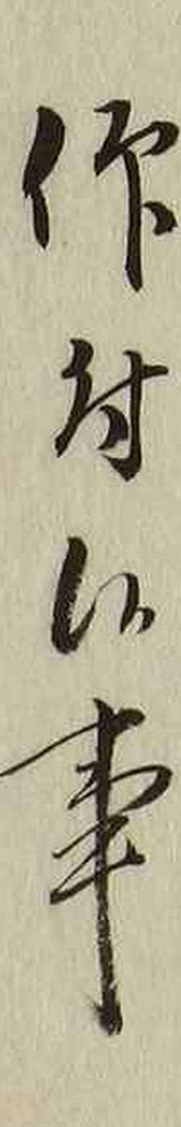仰付候事
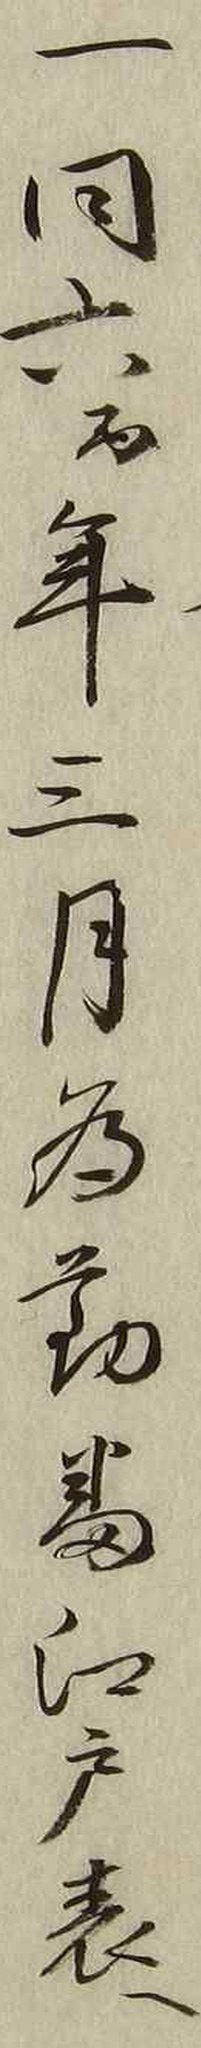一同六酉年三月為勤番江戸表へ
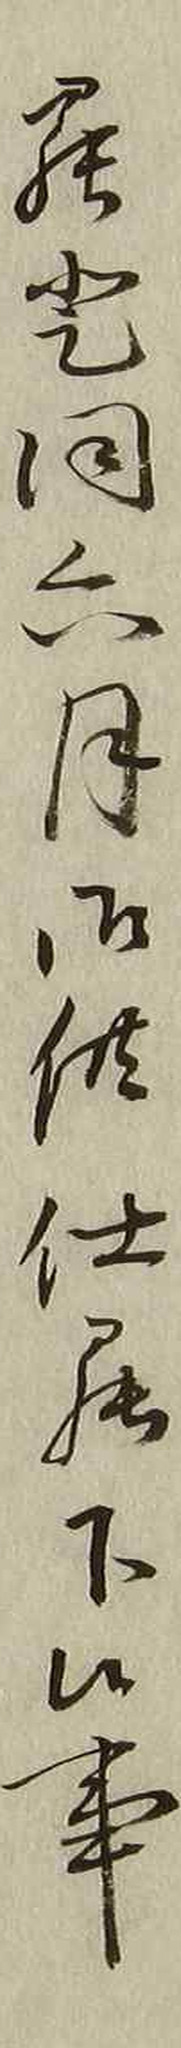罷登同六月御供仕罷下候事
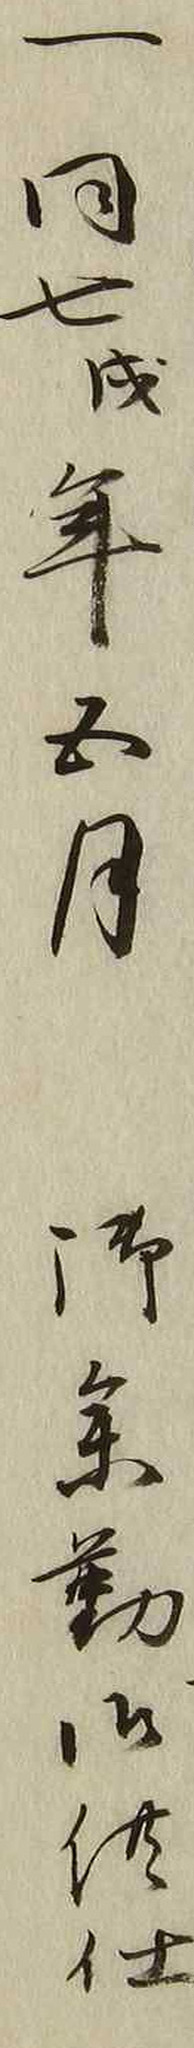一同七戌年五月御参勤御供仕
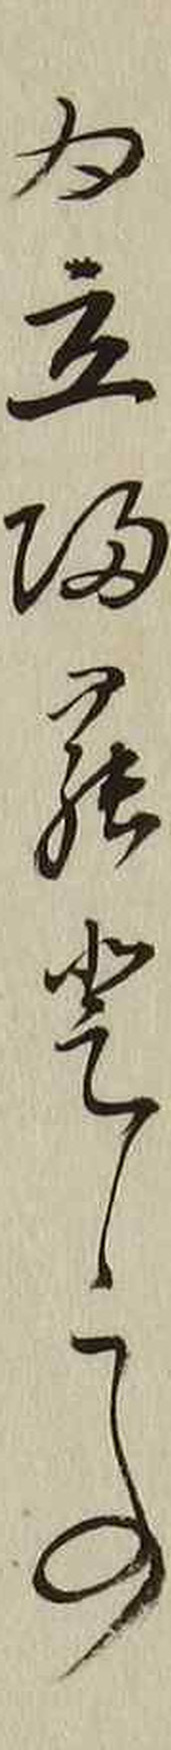為立帰罷登候事
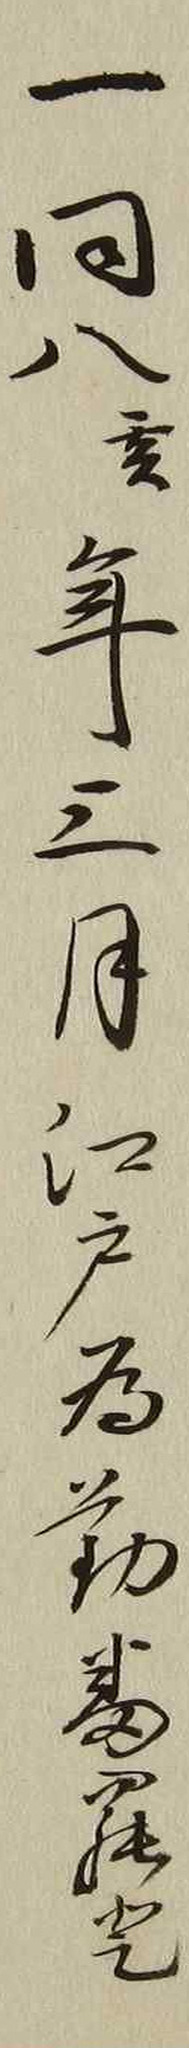一同八亥三月江戸為勤番罷登
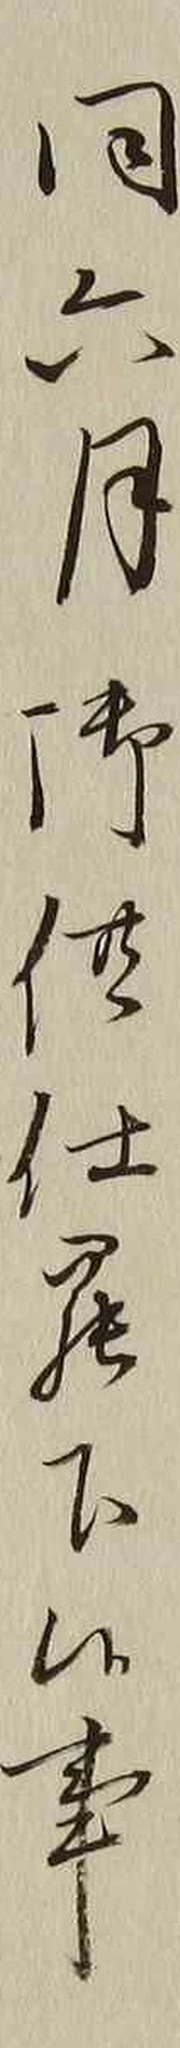同六月御供仕罷下候事
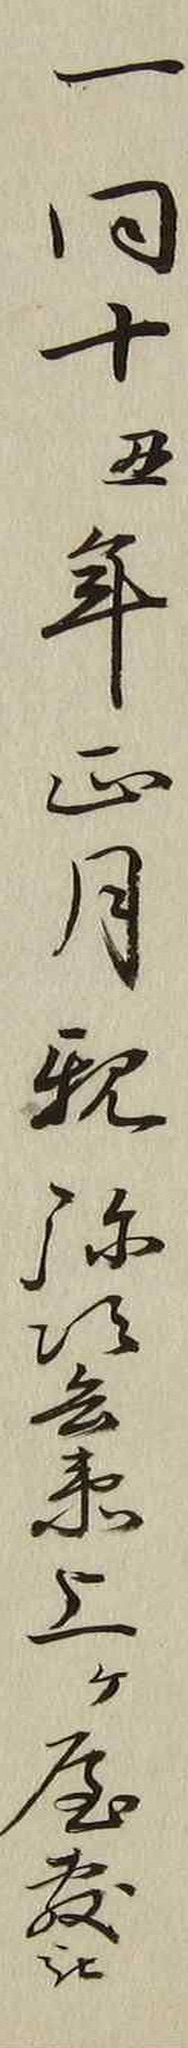一同十丑年正月親弥次兵衛上ヶ屋敷被
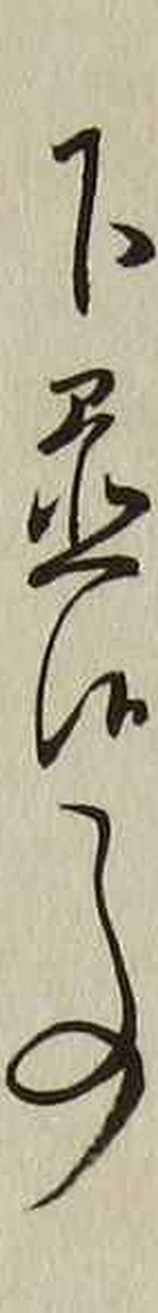下置候事
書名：諸士系譜　巻之19　い之部19
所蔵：会津若松市立会津図書館
